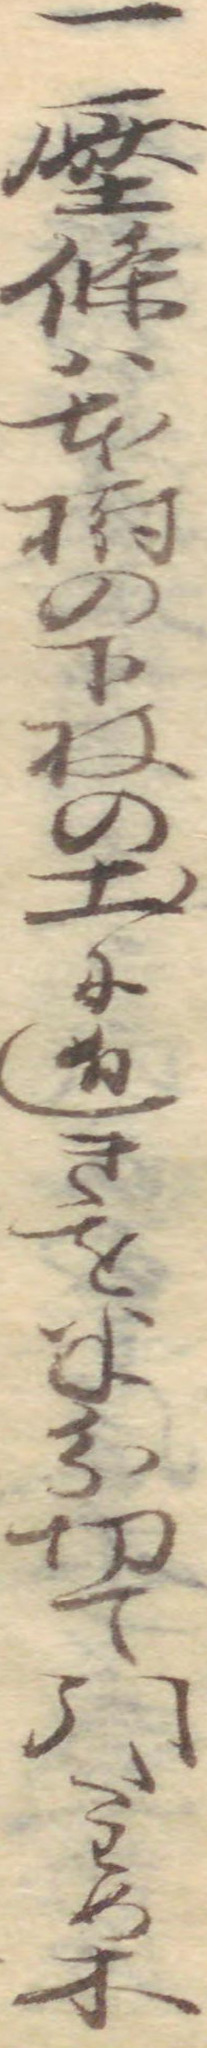一壓條ハ本樹の下枝の土に近きを半分切て引たわめ木
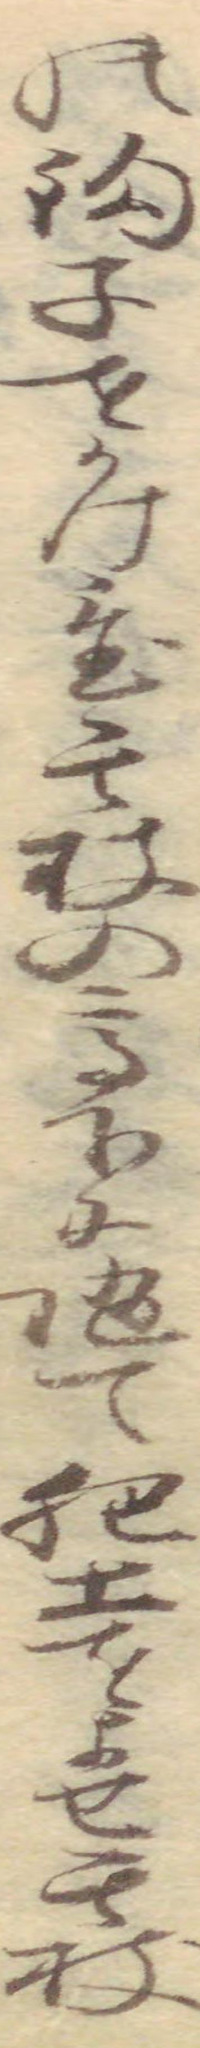風釣子をかけ置其枝の高下に随て肥土をよせ其枝
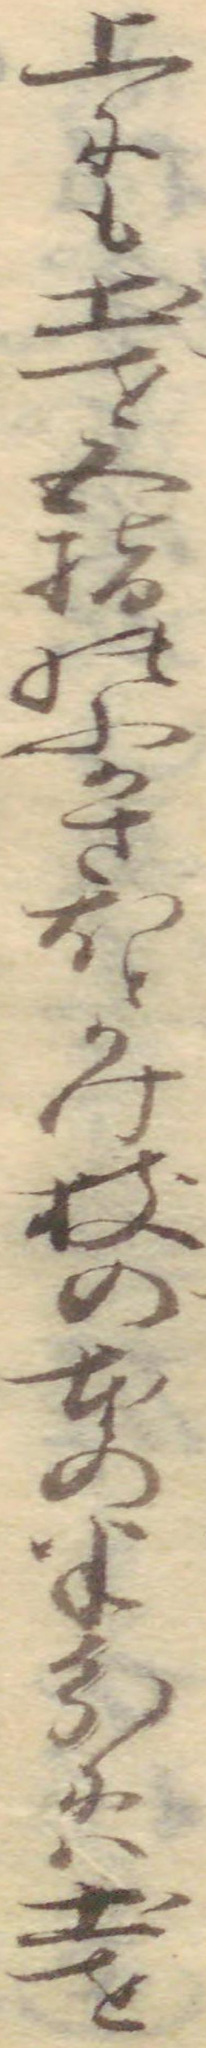上にも土を五指のふかさほとかけ枝の本の半分にハ土を
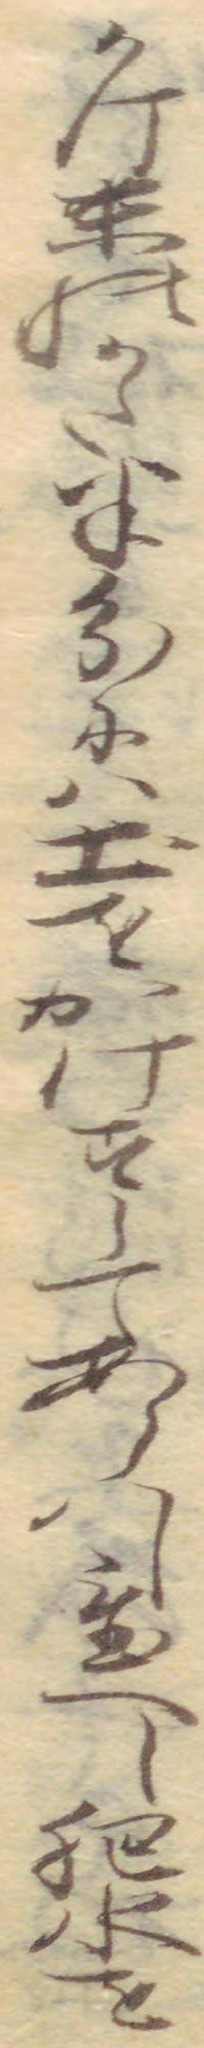かけ末のかた半分にハ土をかけすしてあらはし置へし肥水を

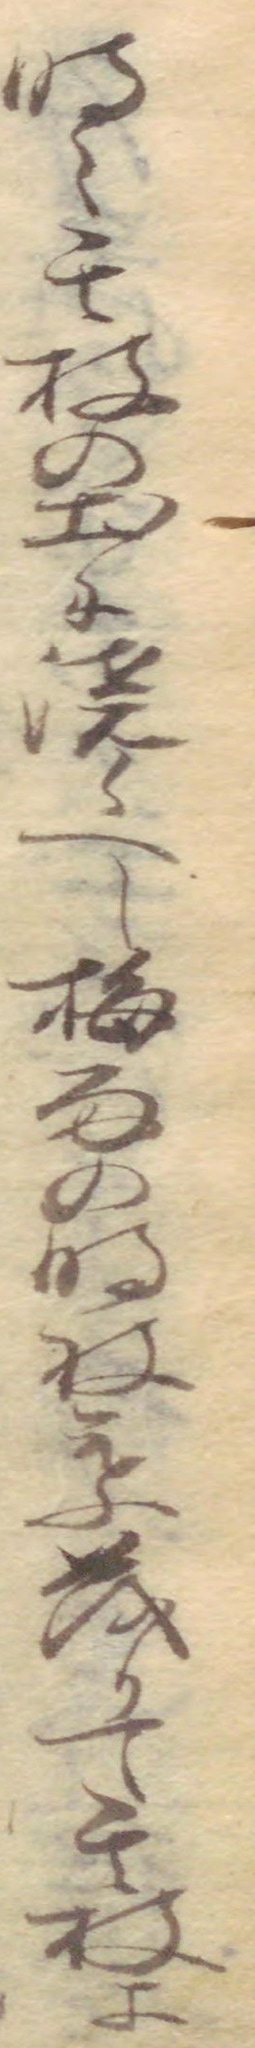時々其枝の土に澆くへし梅雨の時枝葉茂りて其枝に
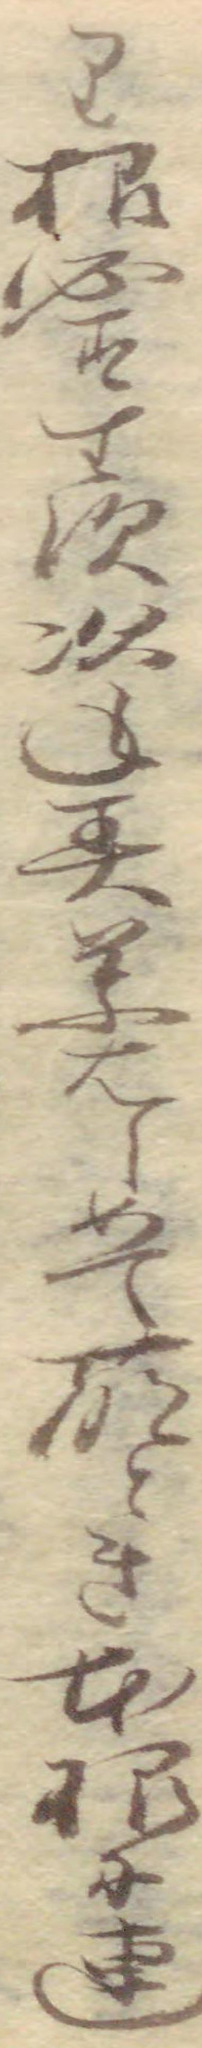も根必す生す次年春葉はしめて萌とき本根に連
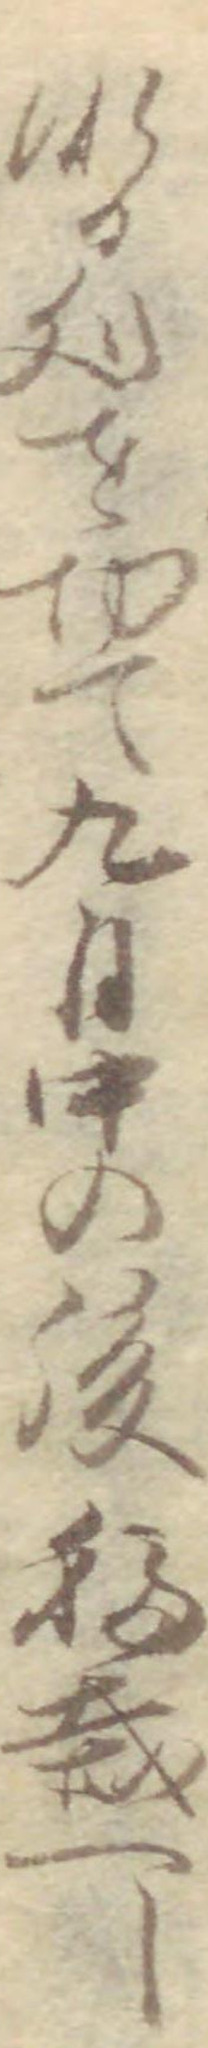なる処を切て九月中の後移栽へし
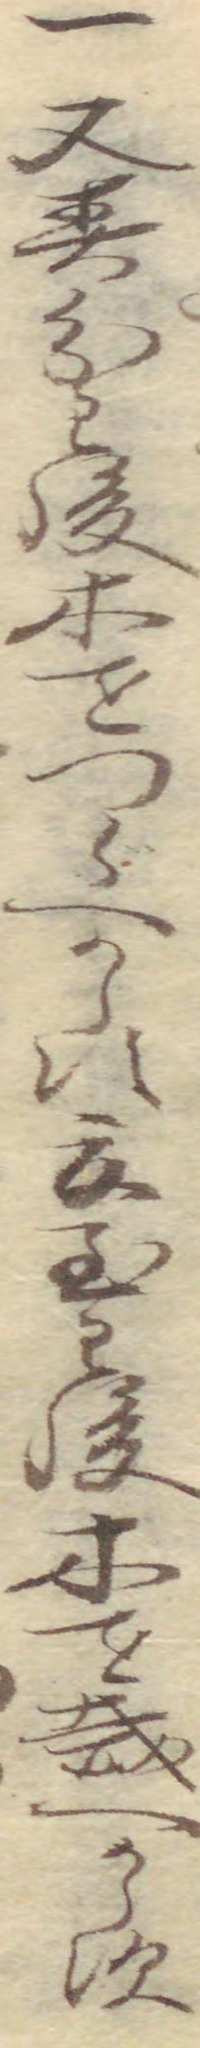一又春分已後木をつぐへからす夏至已後木を栽へからす
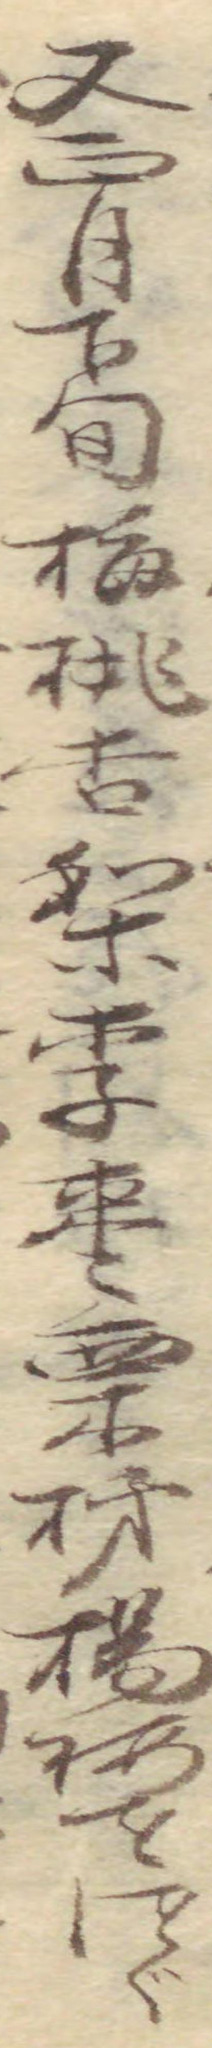又正月上旬梅桃杏梨李棗栗柿楊梅をつぐ
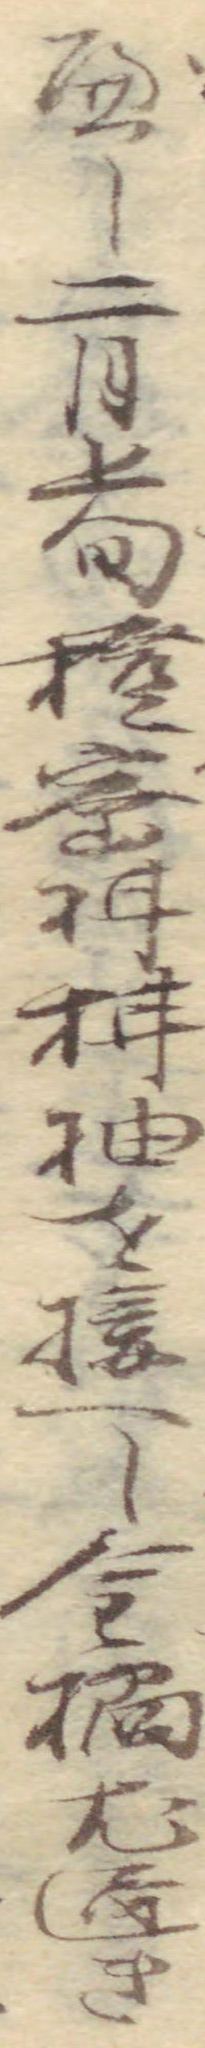べし二月上旬橙蜜柑柑柚を接へし金橘尤遅き
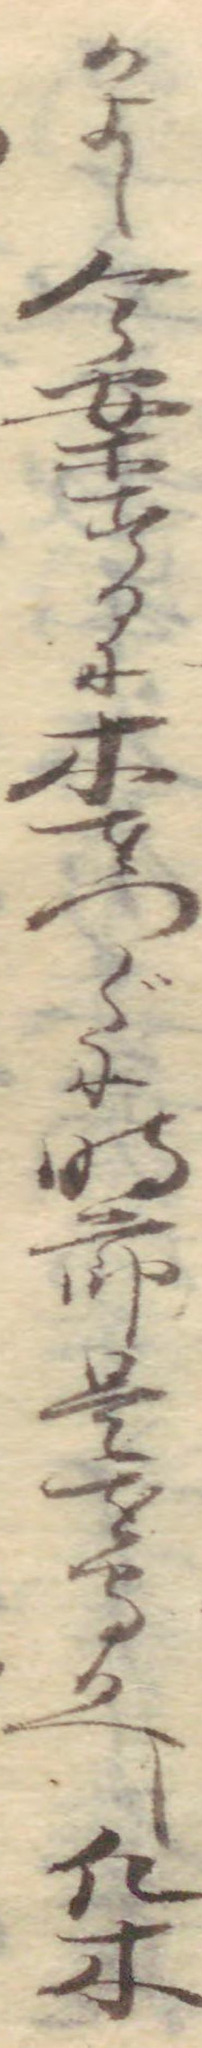かよし今案するに木をつぐに時節是を守るへし凡木
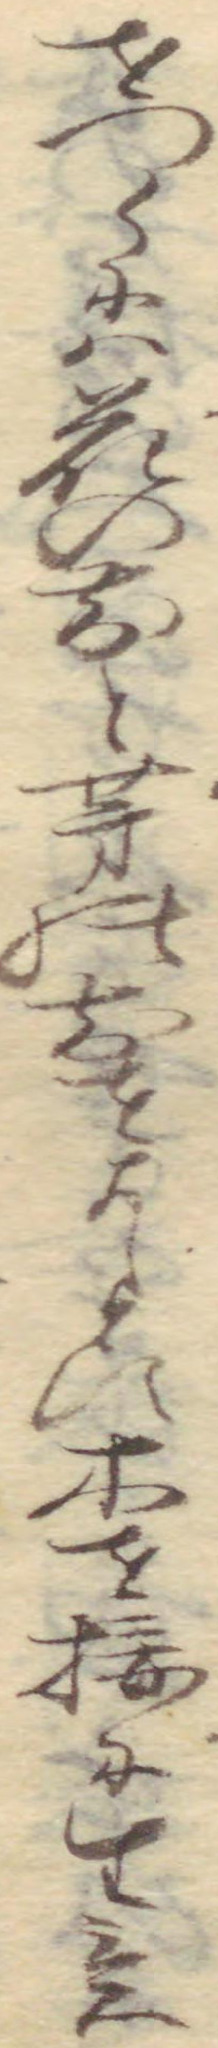をつくにハ花の前と芽の前をよしとす木を接に生意
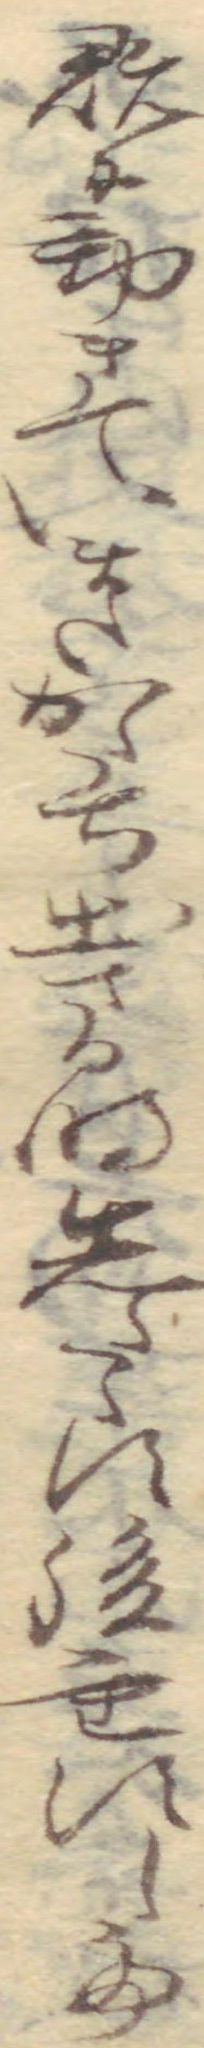既に動きていまたかたち出さる時先たゝす後れすして
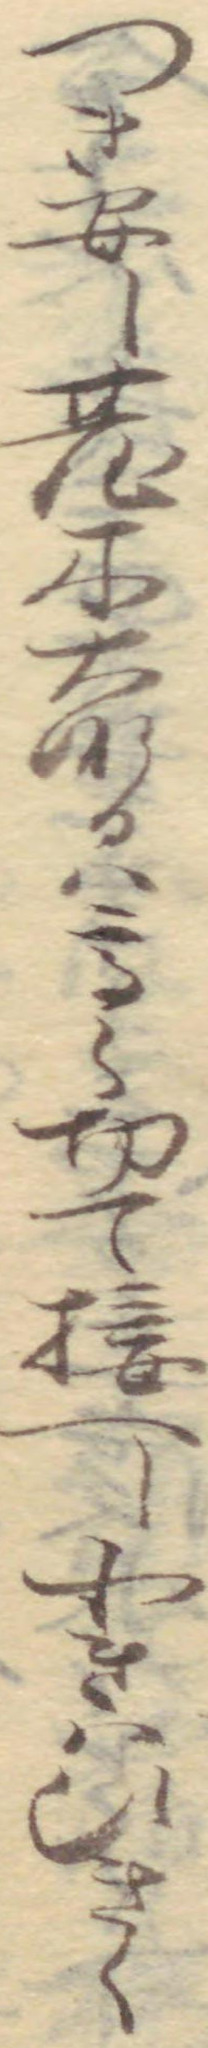つき安し老木大なるハ高く切て接へし小きハひきく
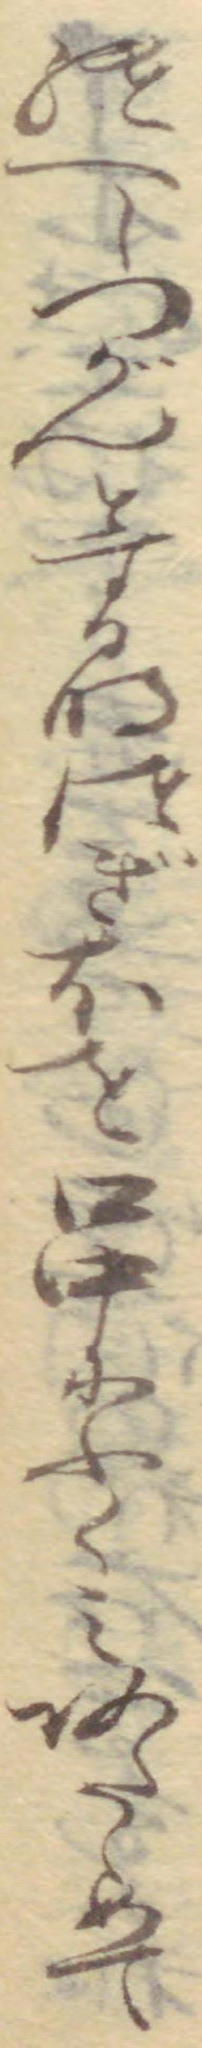継へしつがんとする時つぎほを口中にふくミあたゝめて
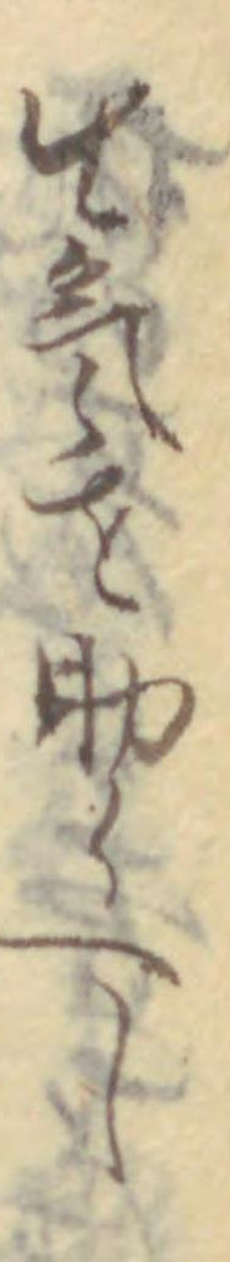生気を助くへし
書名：鶯宿雑記. 巻199-200
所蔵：国立国会図書館 National Diet Library, JAPAN
